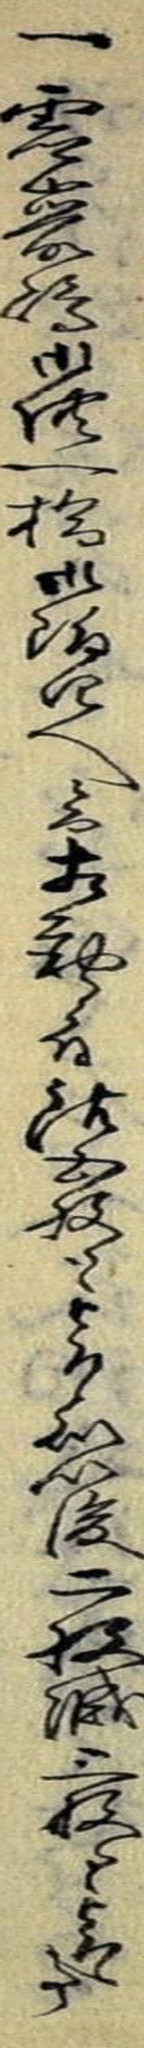一霊厳嶋御供一橋御附四人に而相勤候に付銀五枚つヽ被下候処以後二枚減三枚つヽ被下候事
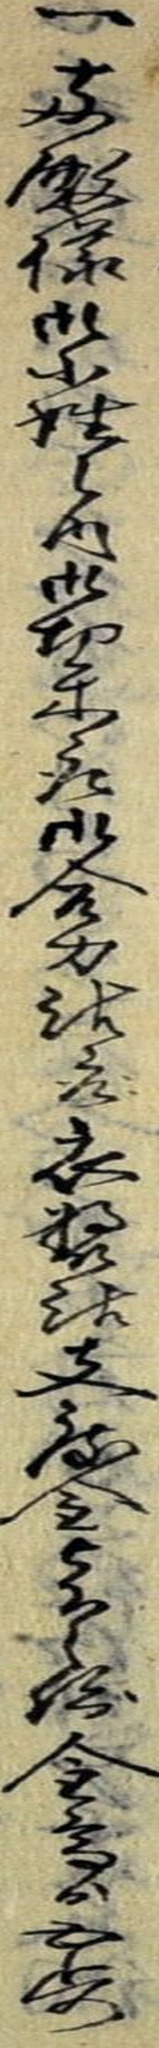一両殿様御小姓之内御切米取御合力銀取衣装銀支度金被下候儀金高ゟ五歩
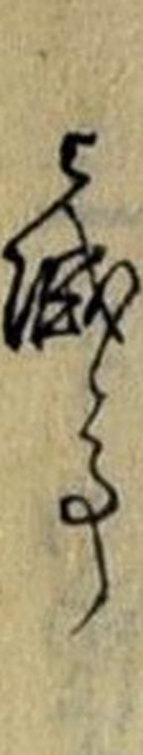被減候事
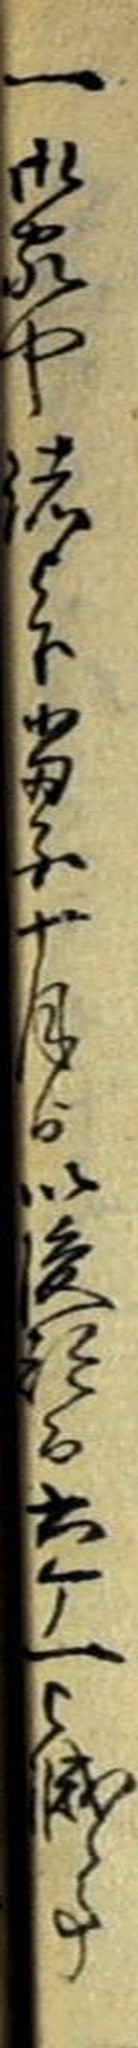一御家中諸被下当子十月ゟ以後都而六ヶ一被減候事
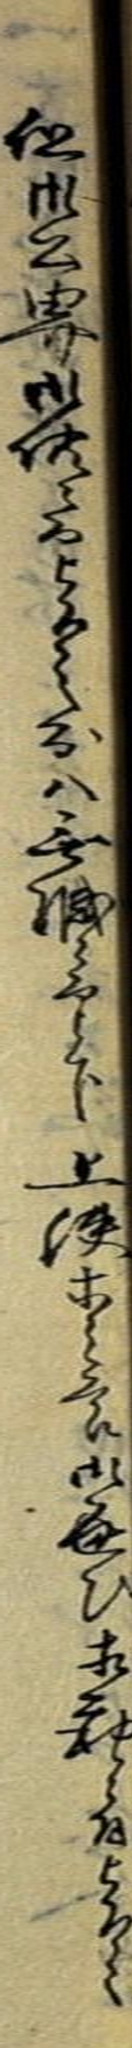但御公界御供に而被下候分は無減に而被下上使等之節は御通行相勤候に付被下之
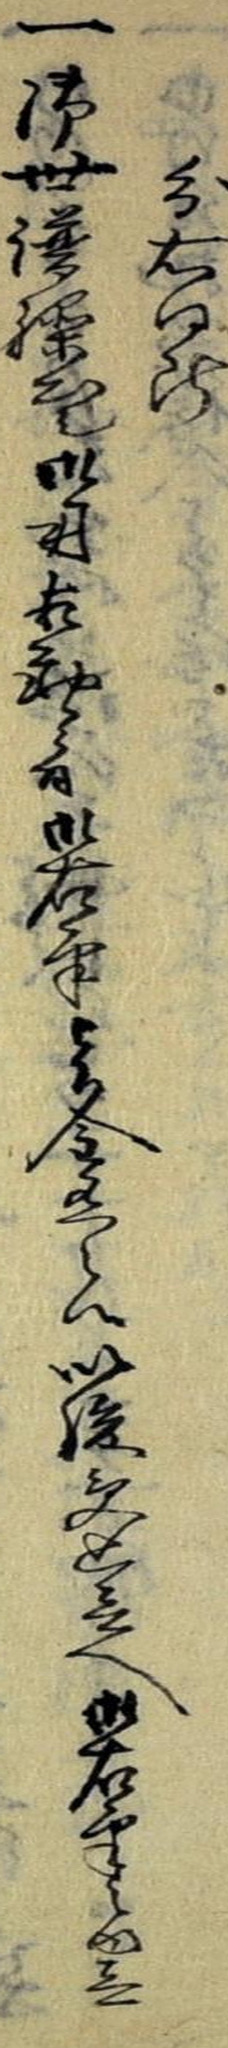一御世譜繰出し御用相勤候に付御右筆被下金有之候以後受込壱人御右筆之内壱
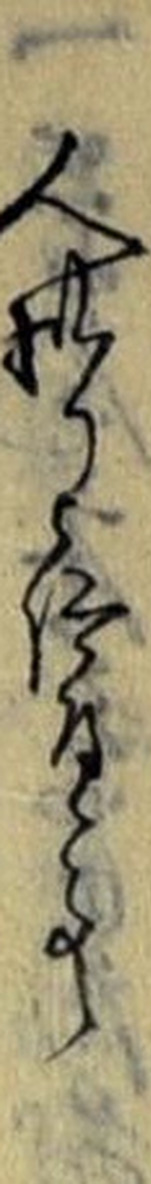人掛り被仰付候事
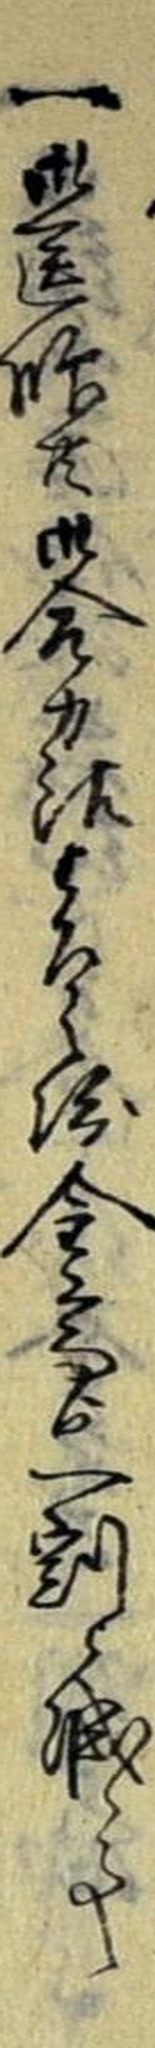一御医師共御合力銀被下之儀金高ゟ一割被減候事
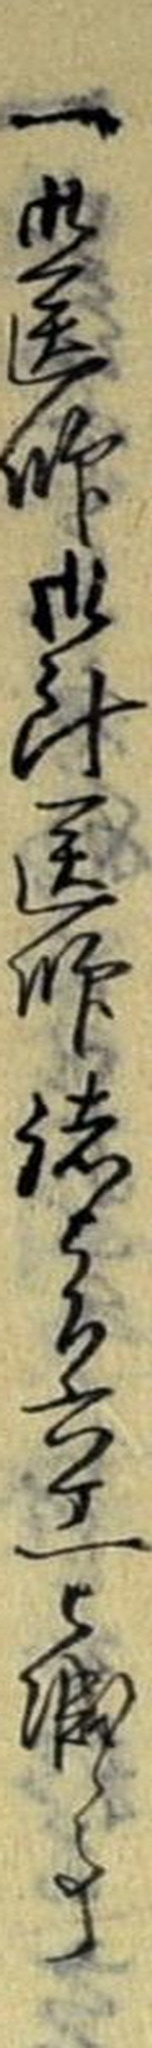一御医師御針医師諸被下六ヶ一被減候事
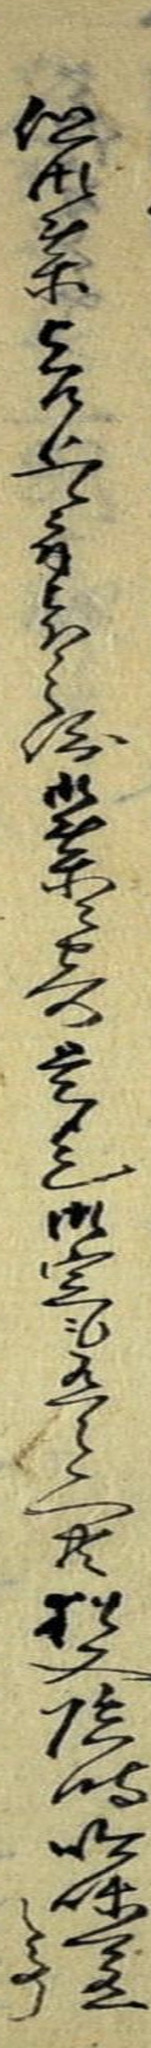但御薬差上候に付被下候儀御薬に寄是迄御定も有之候へ共猶又臨時吟味可有之候事
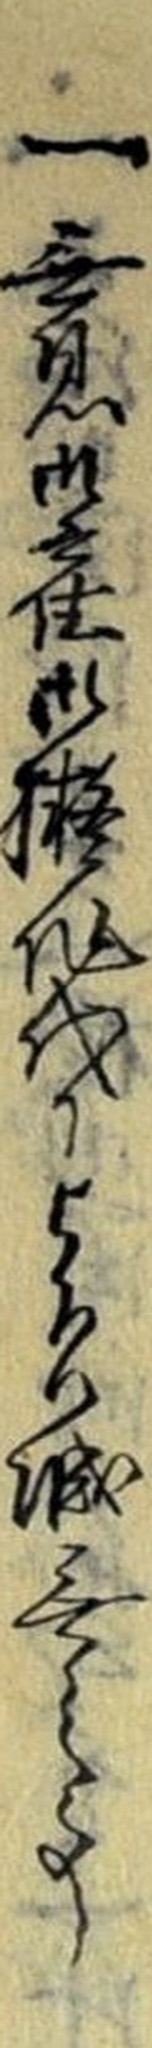一無息御雇御擬作代り被下候減無之事
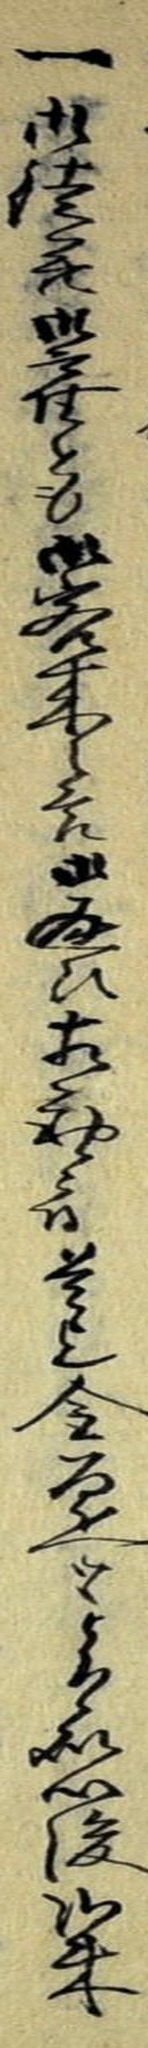一御徒并御雇とも御客来候節御通行相勤候に付是迄勤壱百疋つヽ被下候処以後弐朱
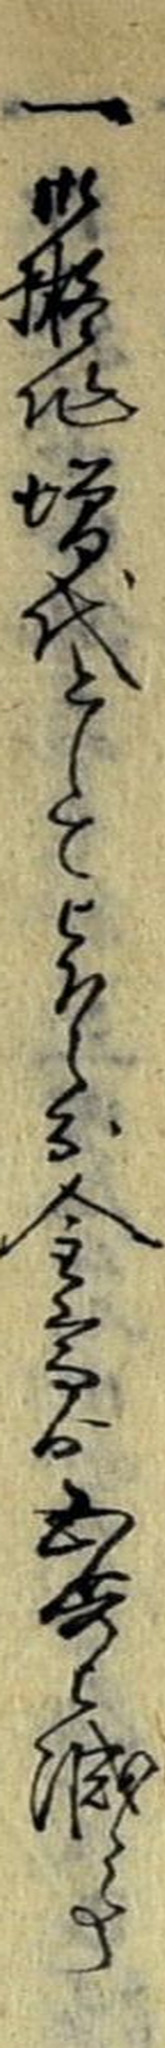一御擬作増代として被下分金高ゟ五歩被減候事
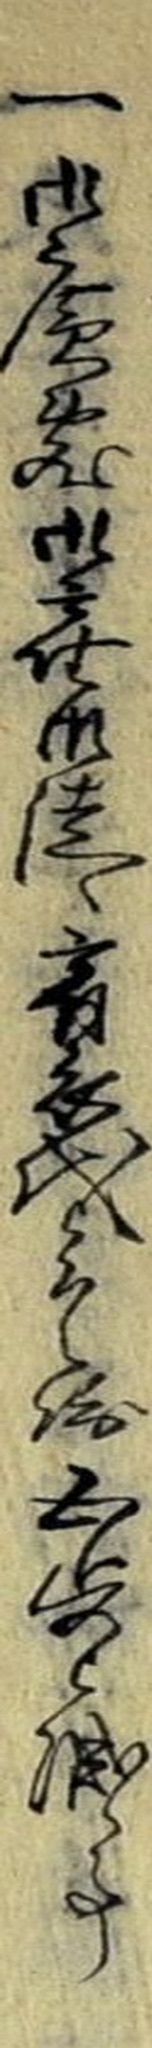一御広敷御雇御徒之者衣代被下候儀五歩被減候事
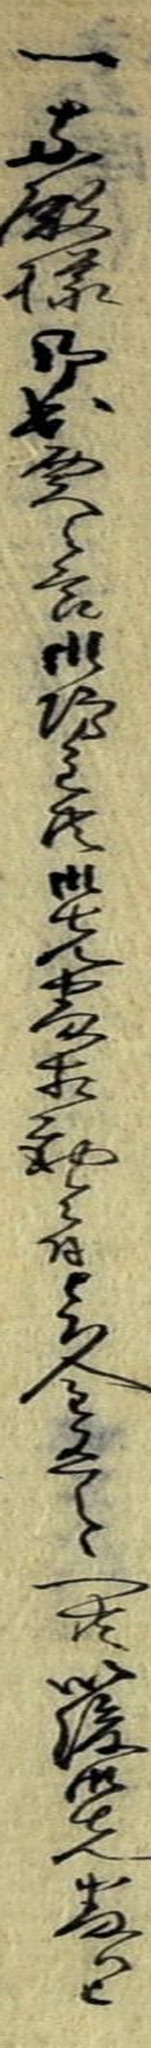一両殿様御出殿之節御坊主共御先番相勤候に付被下金有之候へ共以後御先番は被
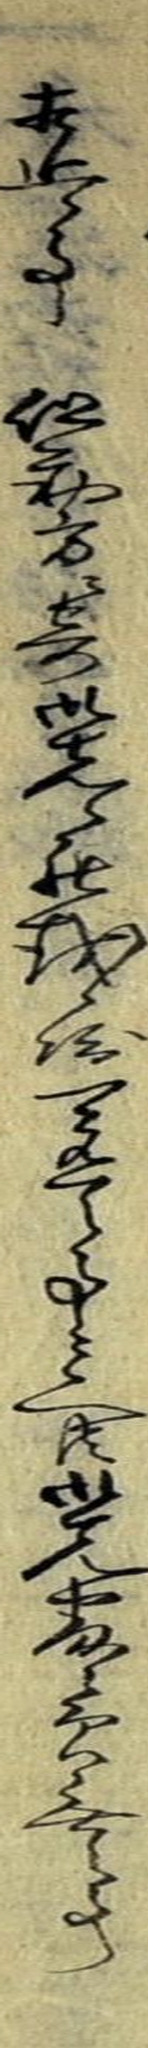相止候事但勤方に寄御先へ罷越候儀可有之事に候へ共御先番に而は無之事
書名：命令之部 四
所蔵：福井県文書館 Fukui Prefectural Archives
